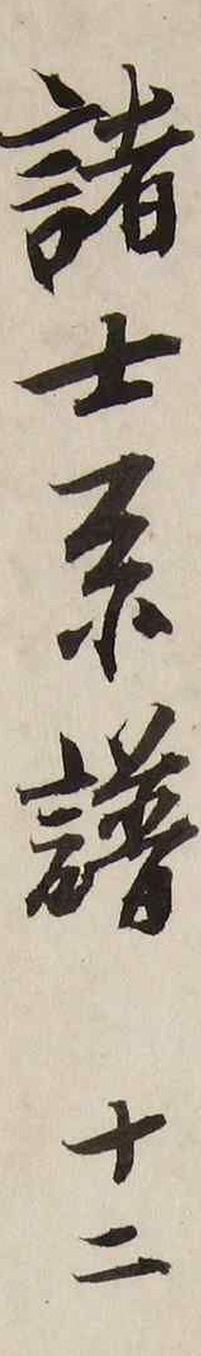諸士系譜十二

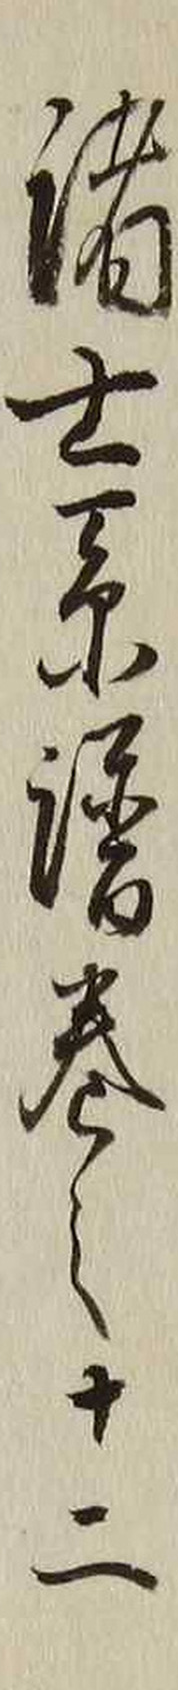諸士系譜巻之十二
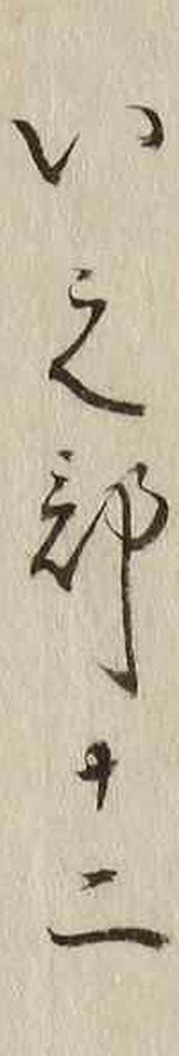い之部十二
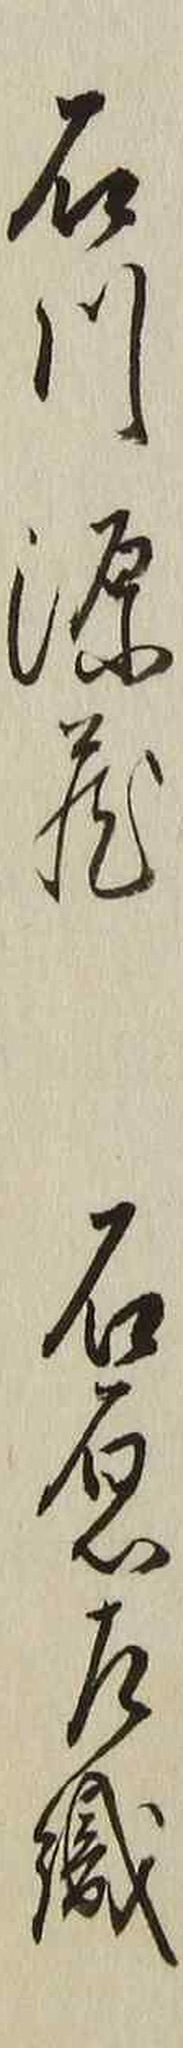石川源蔵石原左織
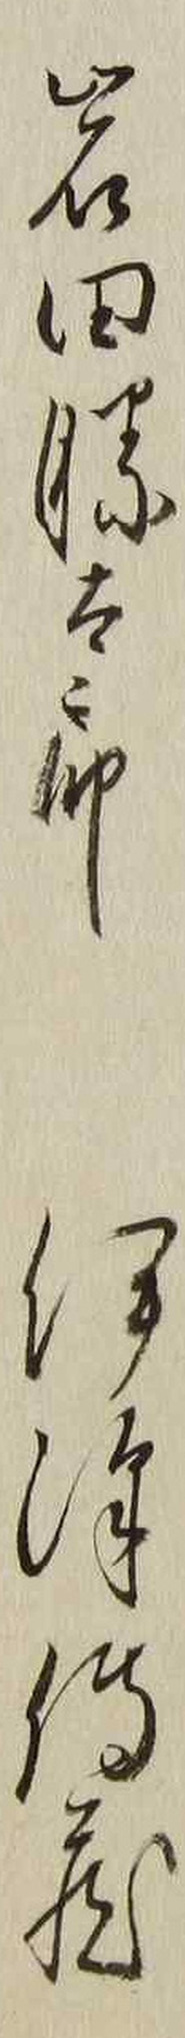岩田勝太郎伊沢伝蔵
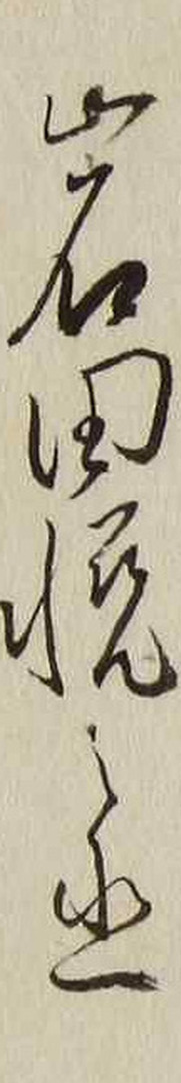岩田悦之丞

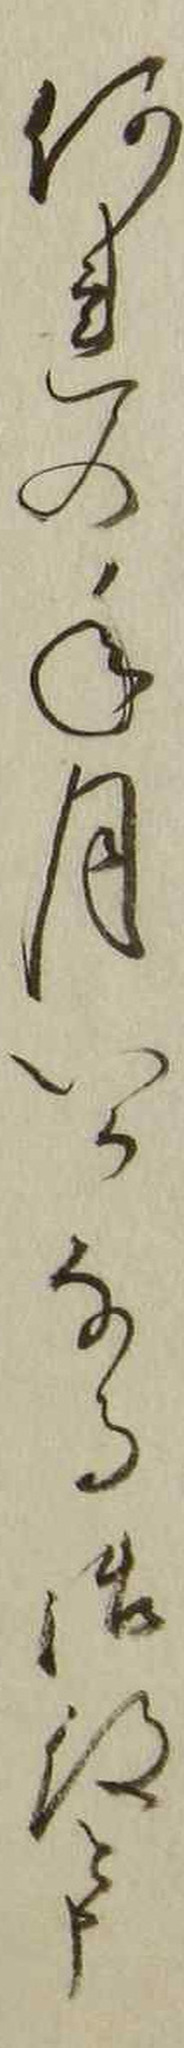何れの年月いかなる御役と申
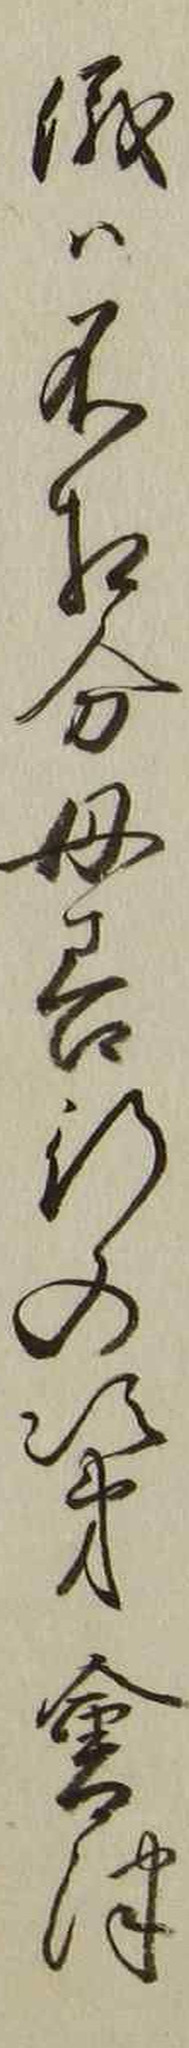儀ハ不相分母善行の次第會津
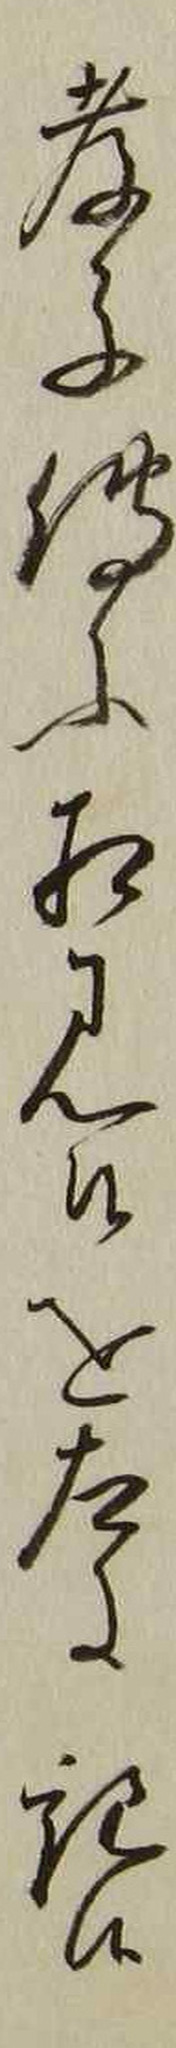孝子傳に相見候を左に記候
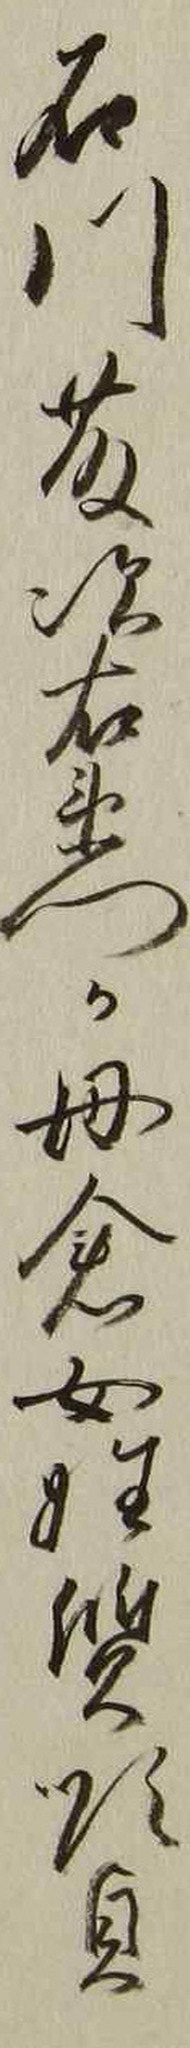石川藤次右衛門か母倉女姓質順貞
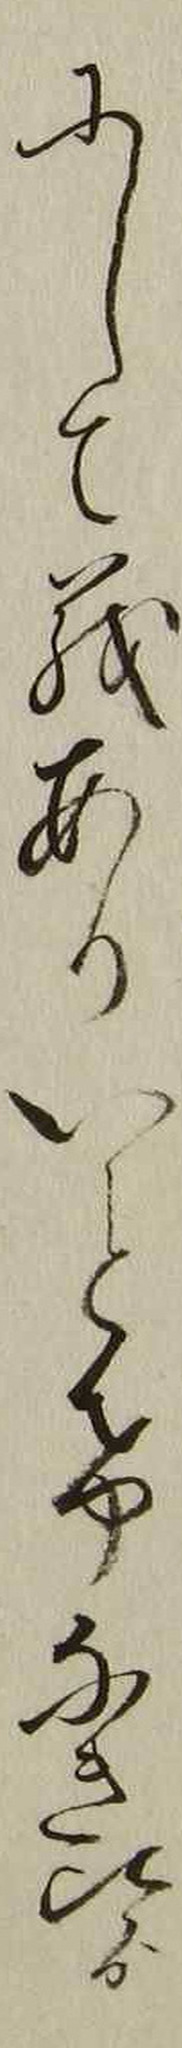にして義ありいとけなき比ゟ
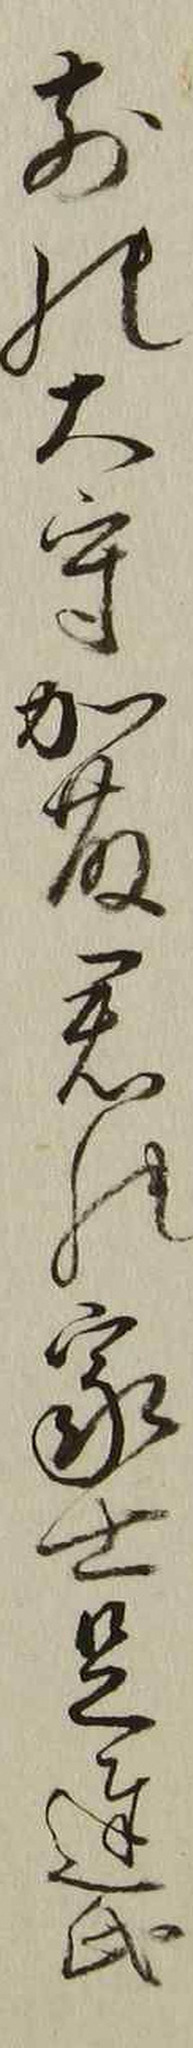前の大守加藤君の家士足達氏
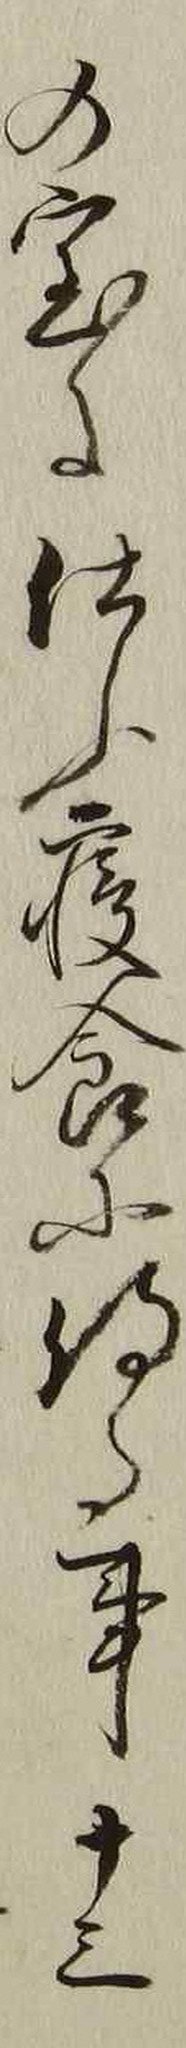の室に仕ふ寝食に侍る事十三
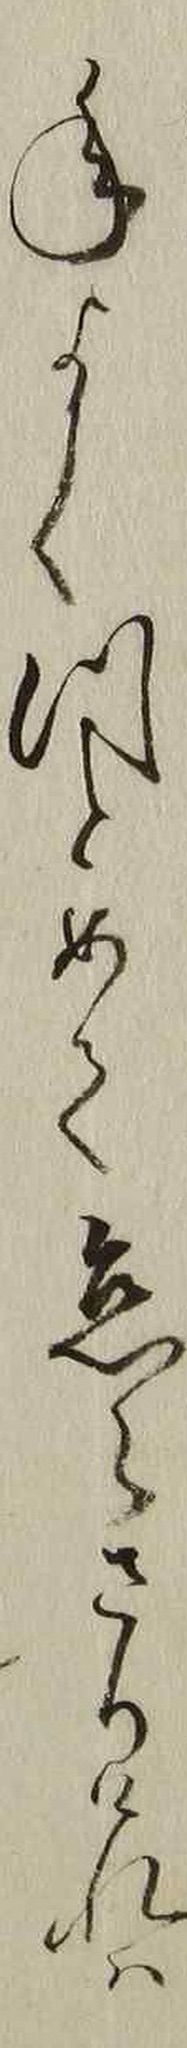年よくつとめて怠らさりけれハ
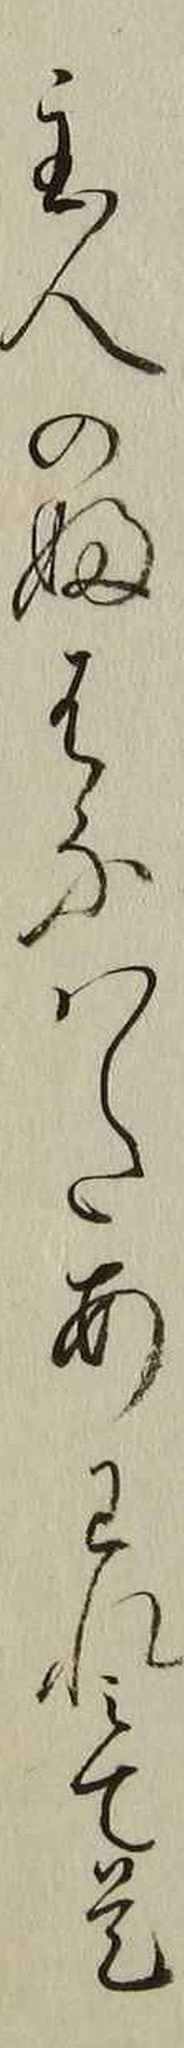主人の婦はなはたあわれみて是
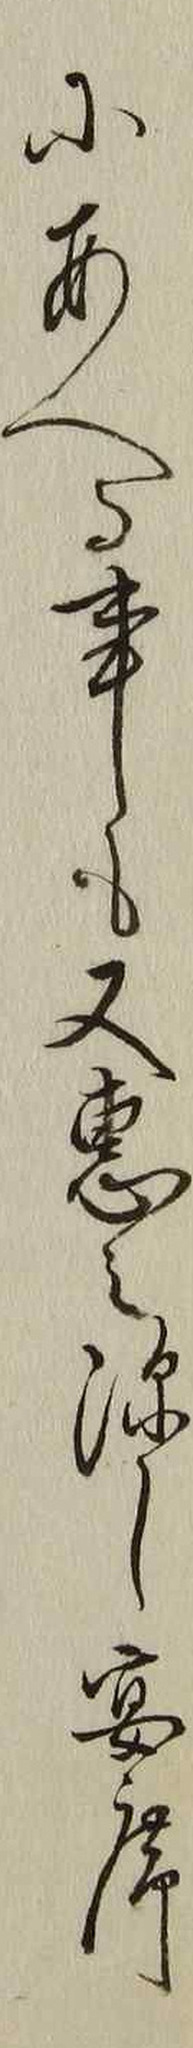にあへる事も又恵ミ深し宴席
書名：諸士系譜　巻之12　い之部12
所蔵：会津若松市立会津図書館
